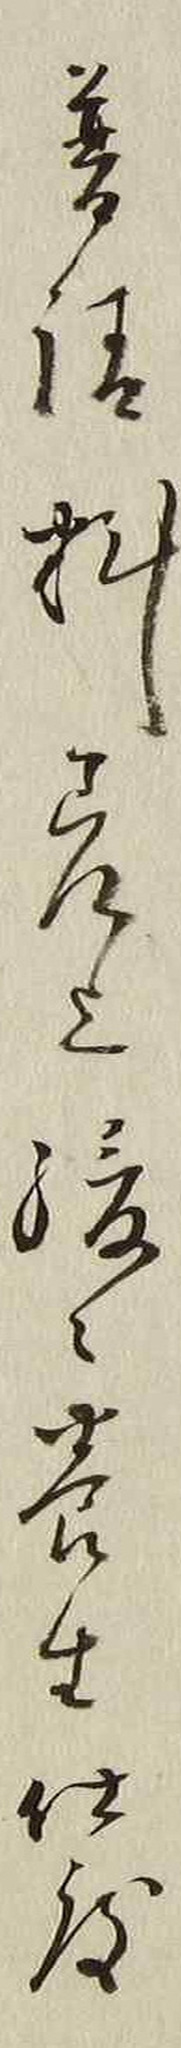普請料差上緩々養生仕度
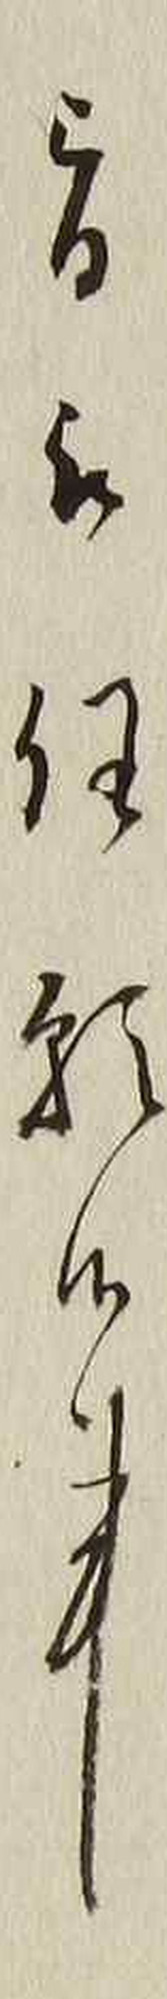旨被任願候事
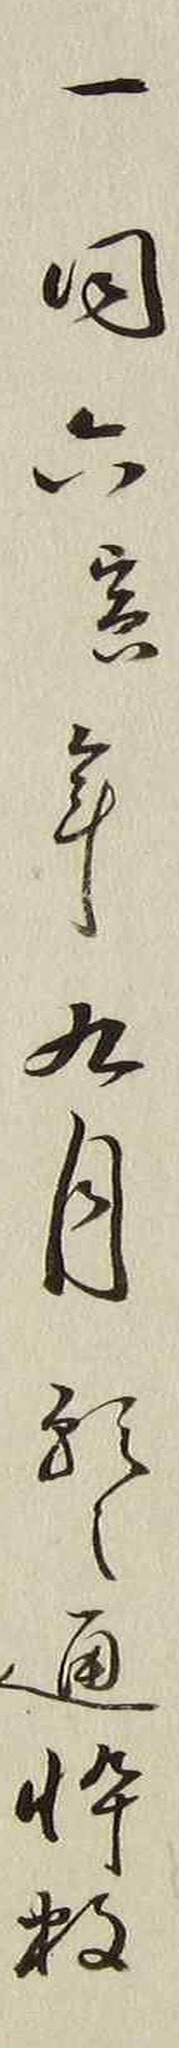一同六寅年九月願之通忰数
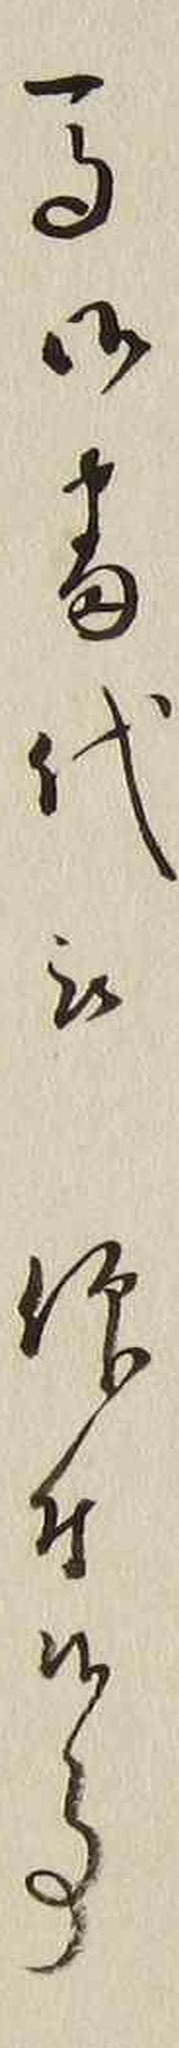馬御番代被仰付候事
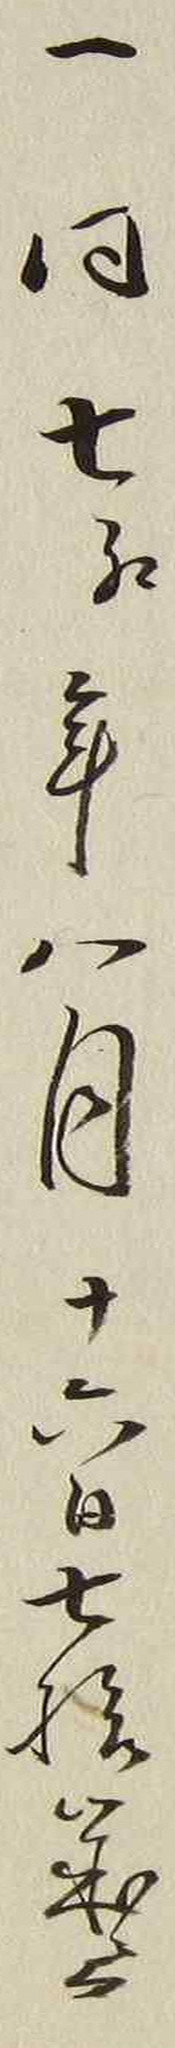一同七卯年八月十六日七拾歳に而
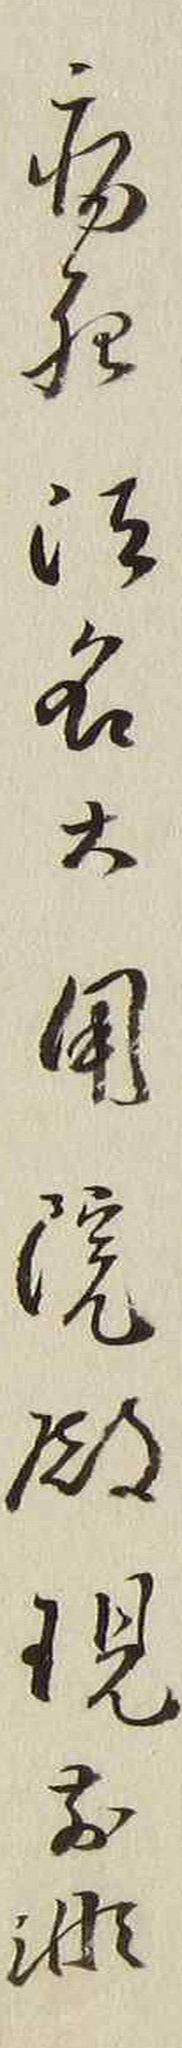病死法名大用院殿現前瀬
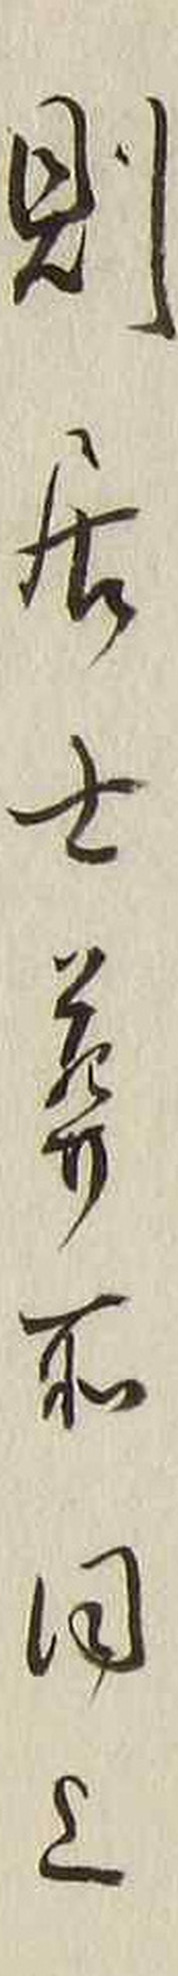則居士葬所同上

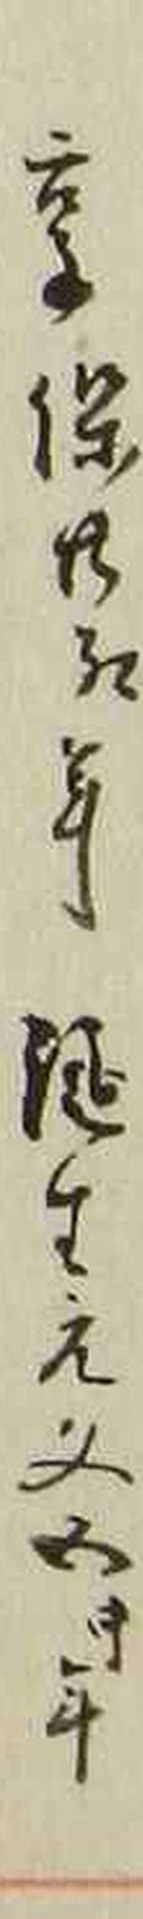享保廿卯年誕生元文五申年
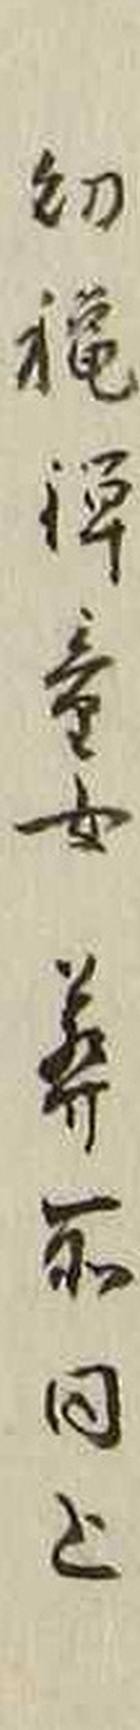幼福禅童女葬所同上
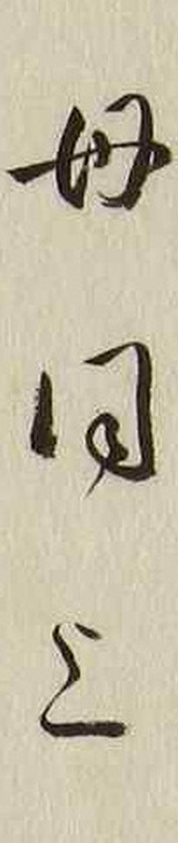母同上
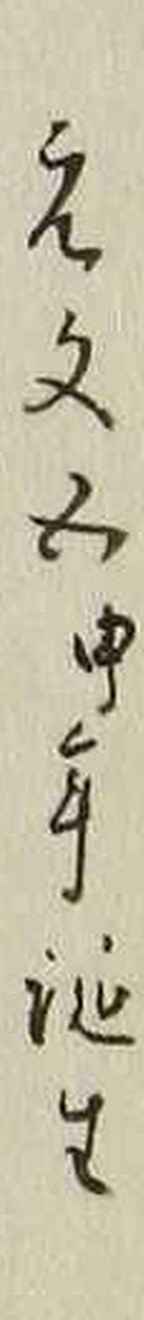元文五申年誕生
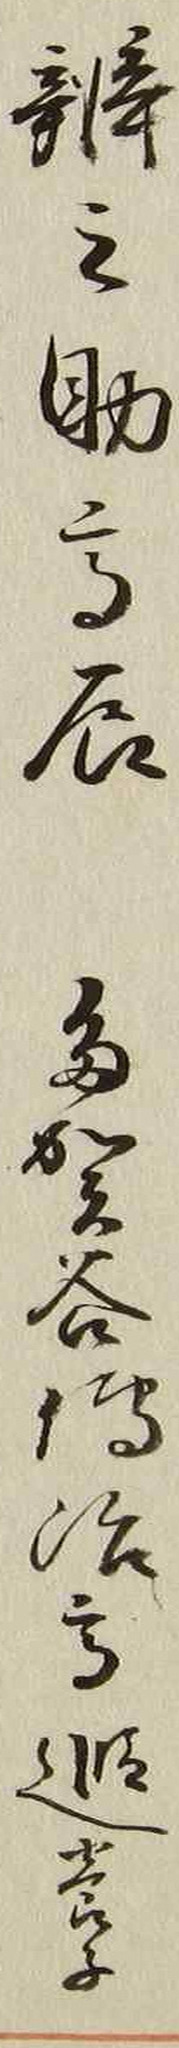辨之助高辰多賀谷伝治高追養子
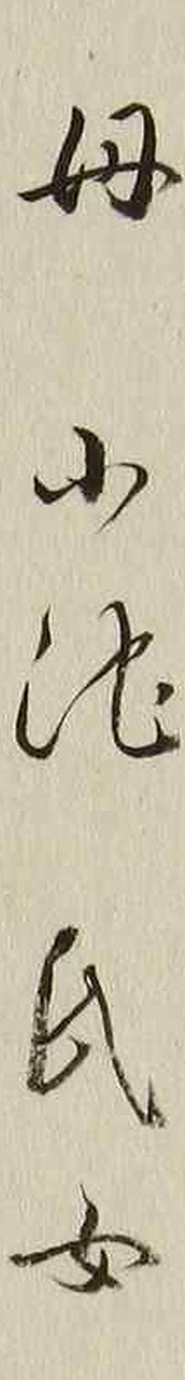母小池氏女
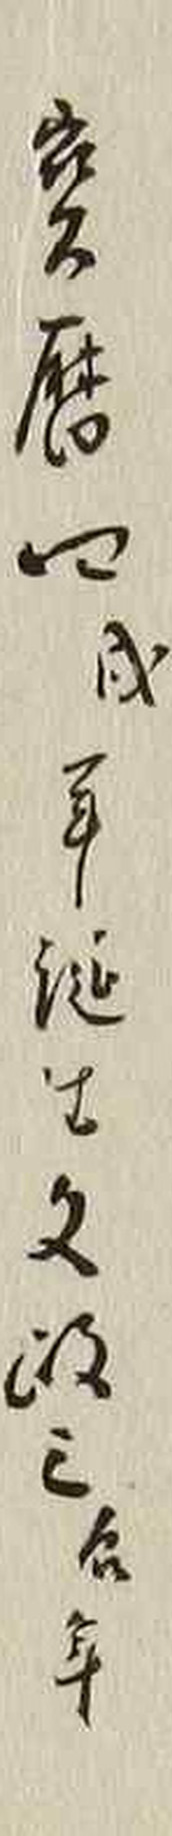宝暦四戌年誕生文政三辰年
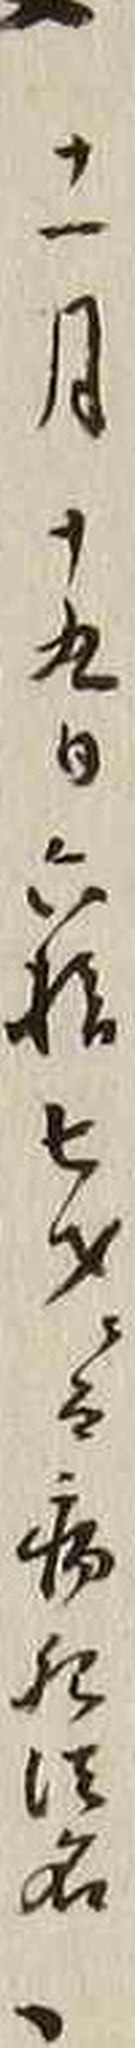女十一月十九日六拾七才に而病死法名
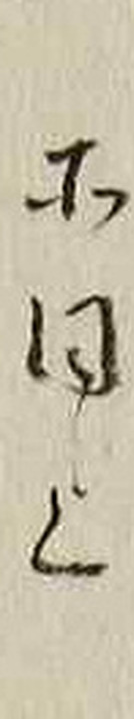所同上
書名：諸士系譜　巻之159　な之部1
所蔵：会津若松市立会津図書館
